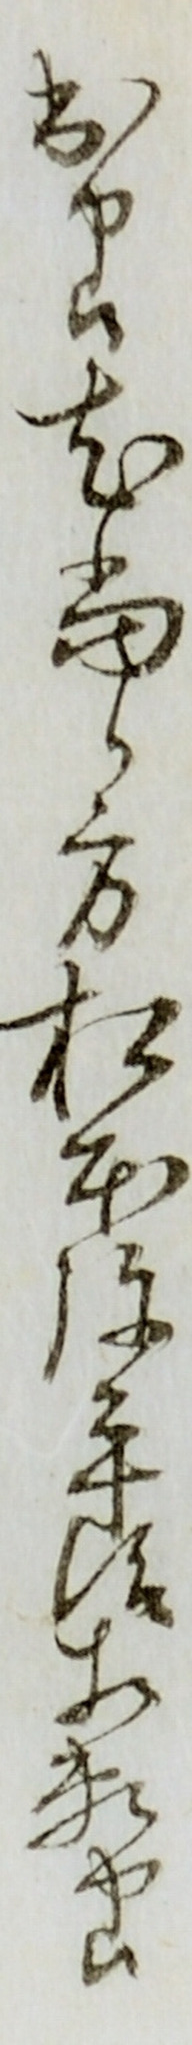出申候尤当り方松本弥平治相頼申候
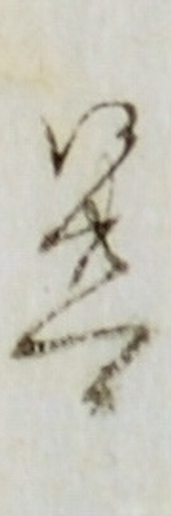同廿一日
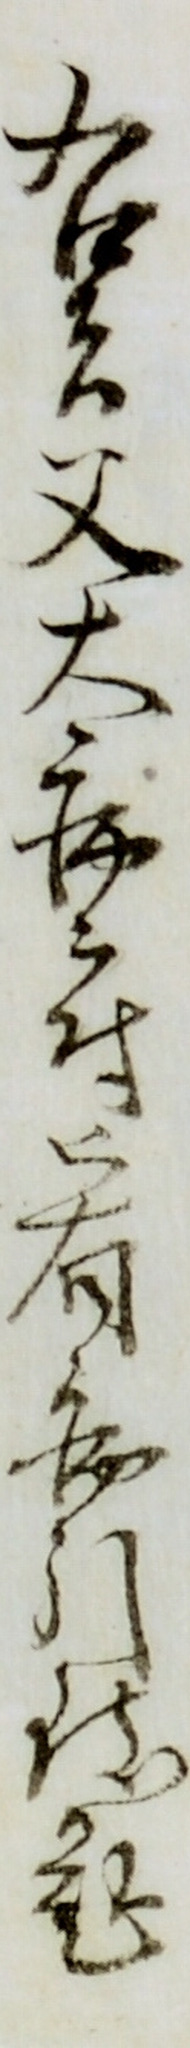右は父大病に付病引致候趣
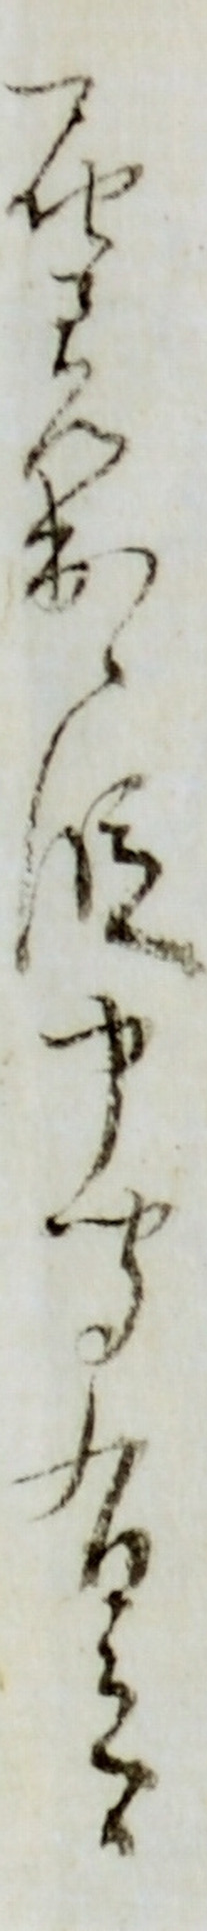届差出候段申聞有之候
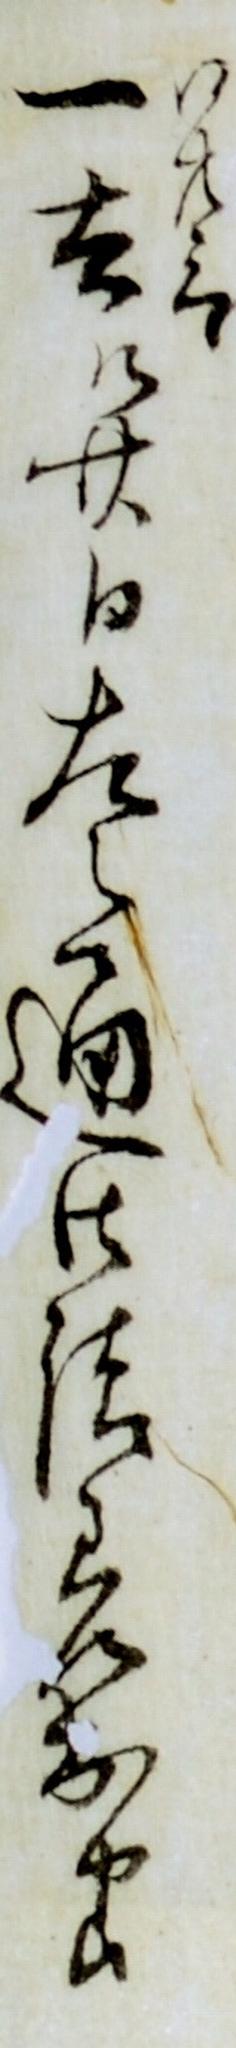一去ル廿日左之通御法差出申候

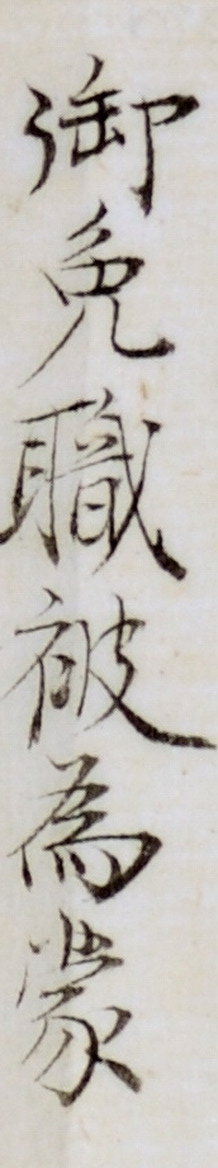御免職被為蒙
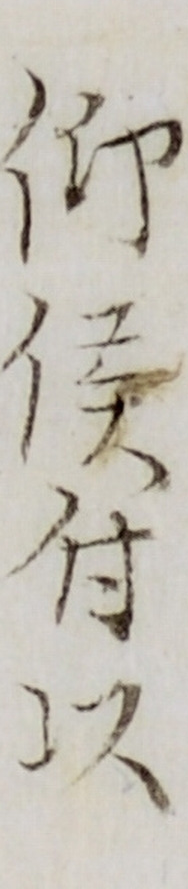仰候付以
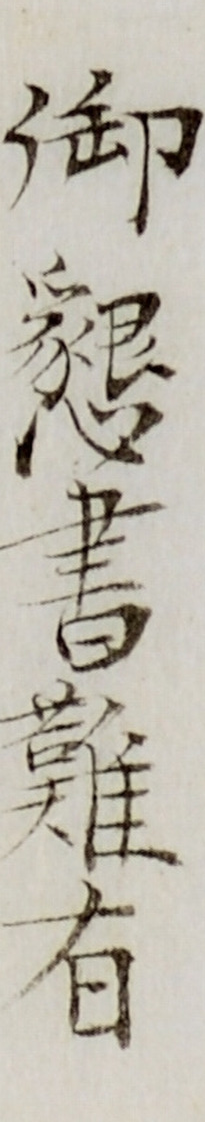御懇書難有
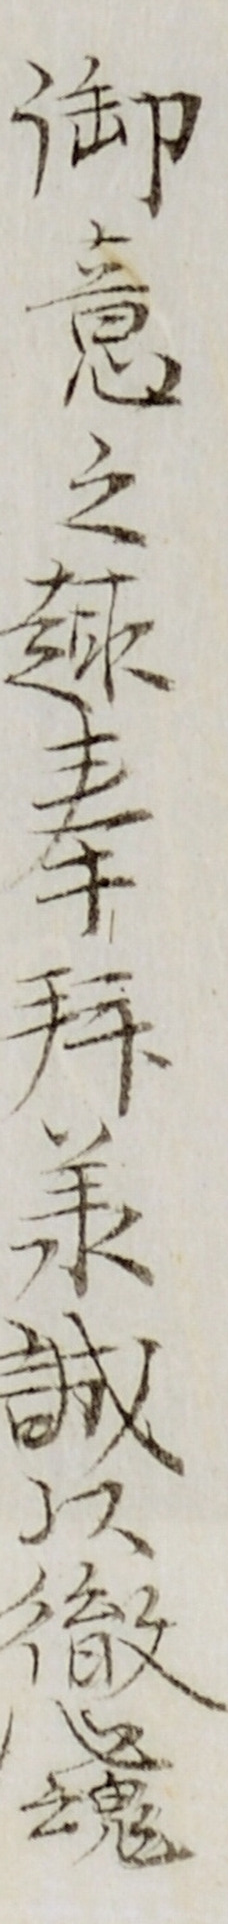御意之趣奉拝承誠以徹心魂
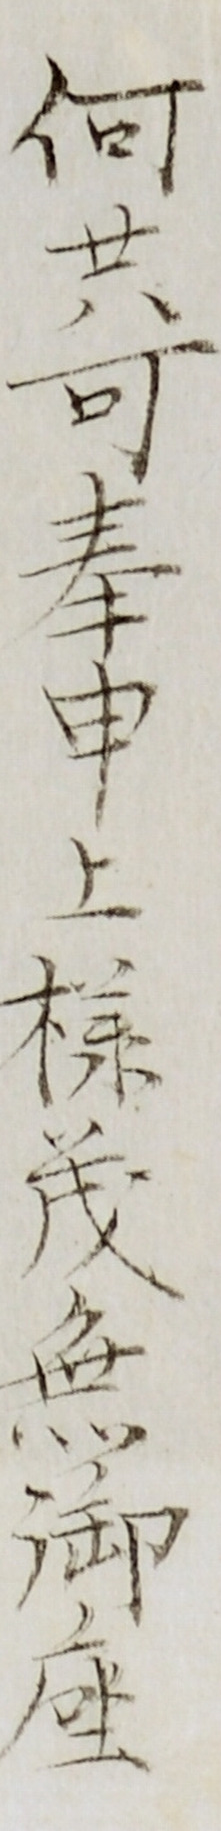何共可奉申上様茂無御座
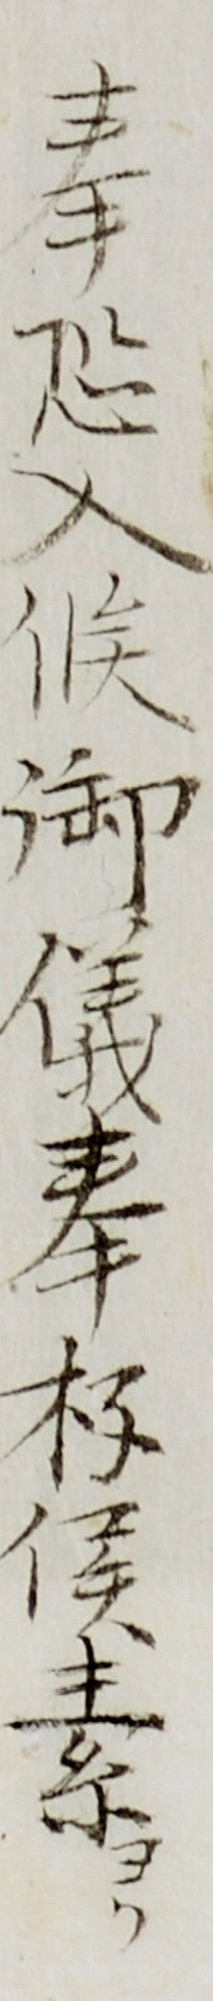奉恐入候御儀奉存候素ヨリ
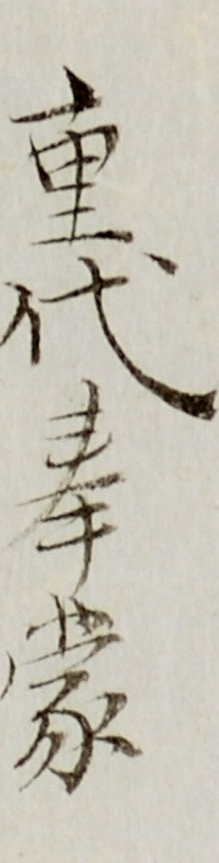重代奉蒙
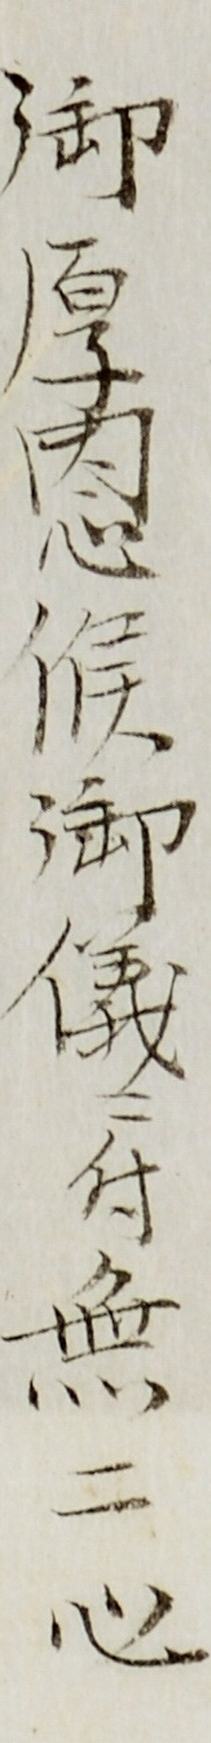御厚恩候御儀ニ付無二心
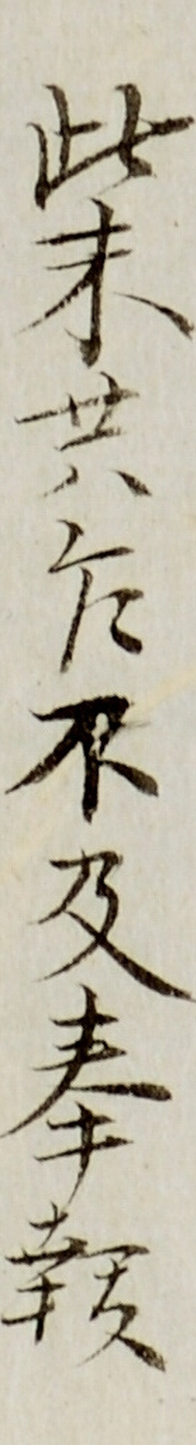此末共乍不及奉報
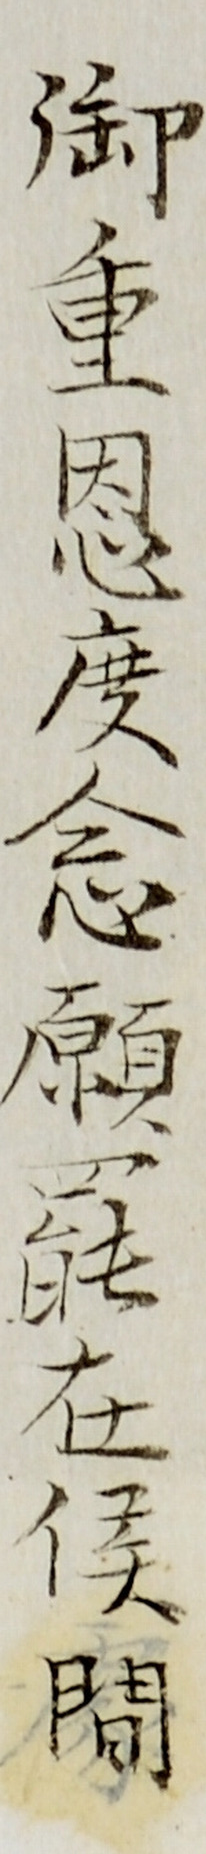御重恩度念願罷在候間
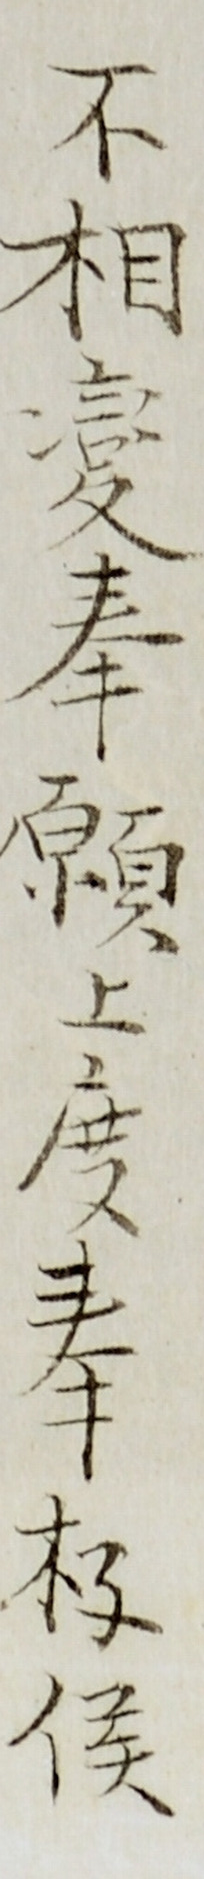不相変奉願上度奉存候
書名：山林方諸事御用留
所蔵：伊那市立高遠町図書館・合同会社AMANE
